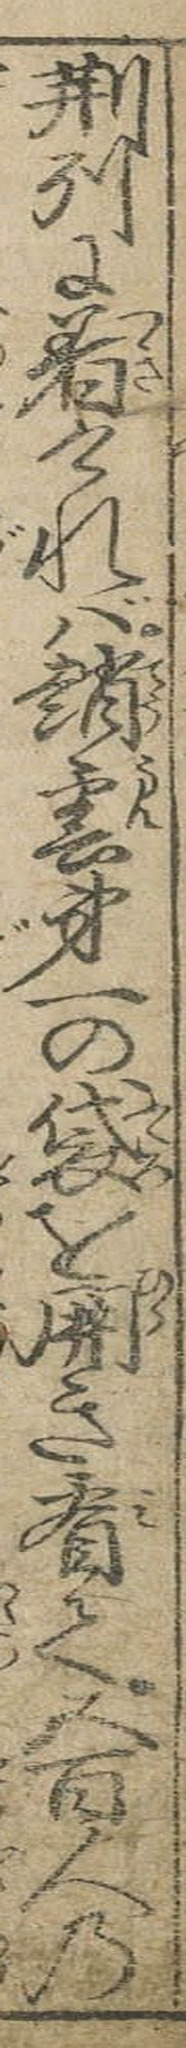荊州に着ければ。趙雲第一の袋を開き看て。五百人の
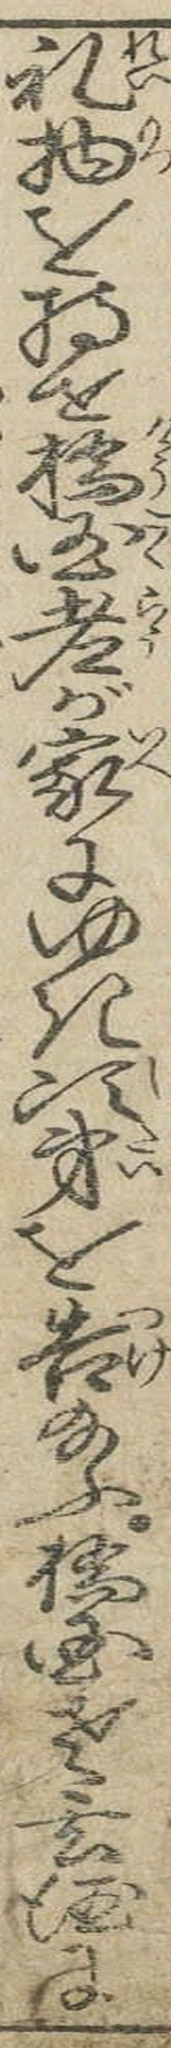礼物を持せ橋国老が家にゆき次第を告給ふ。橋国老玄徳に
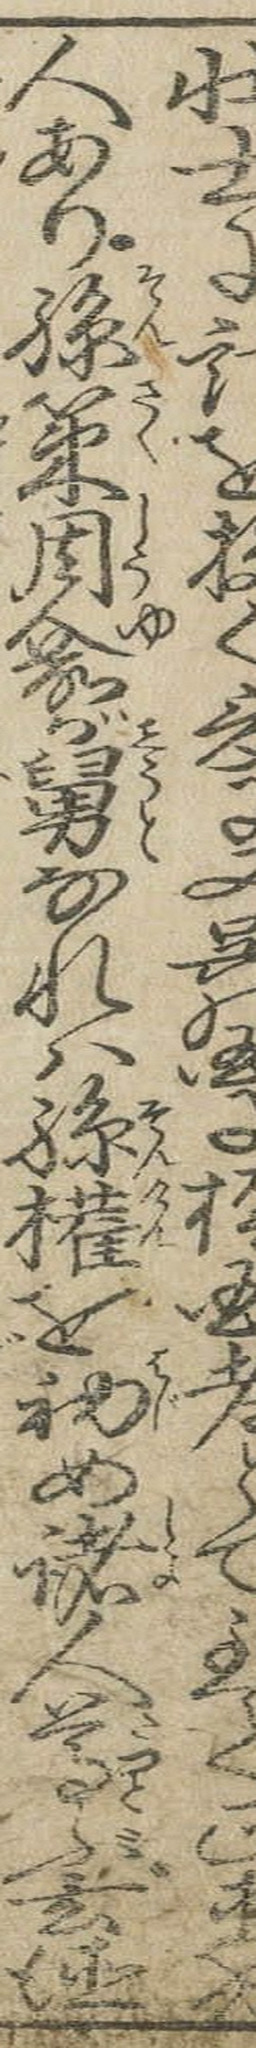人あり。孫策周兪が舅なれは孫権を初め諸人尊ぶ。玄徳
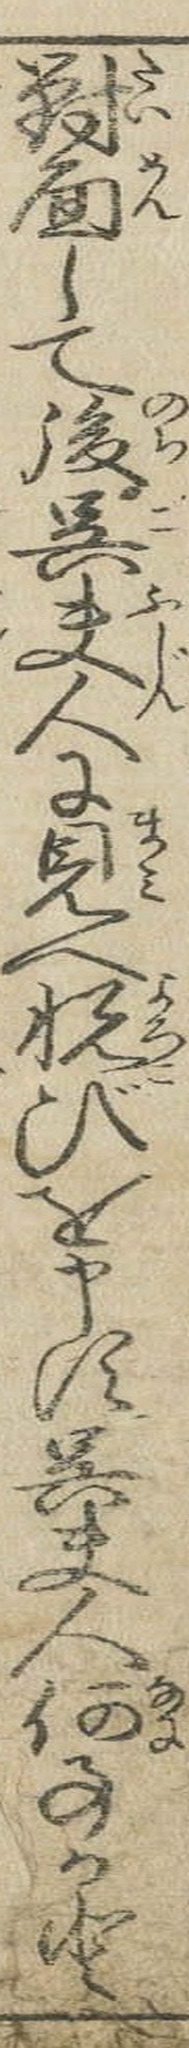対面して後。呉夫人に見へ悦びを申す。呉夫人何事かと
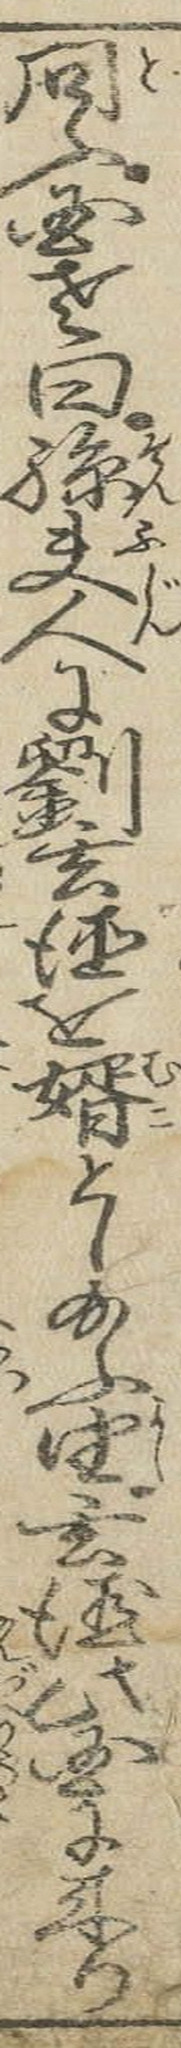問ふ。国老曰。孫夫人に劉玄徳を婿とし給ふ由。玄徳此国に来り
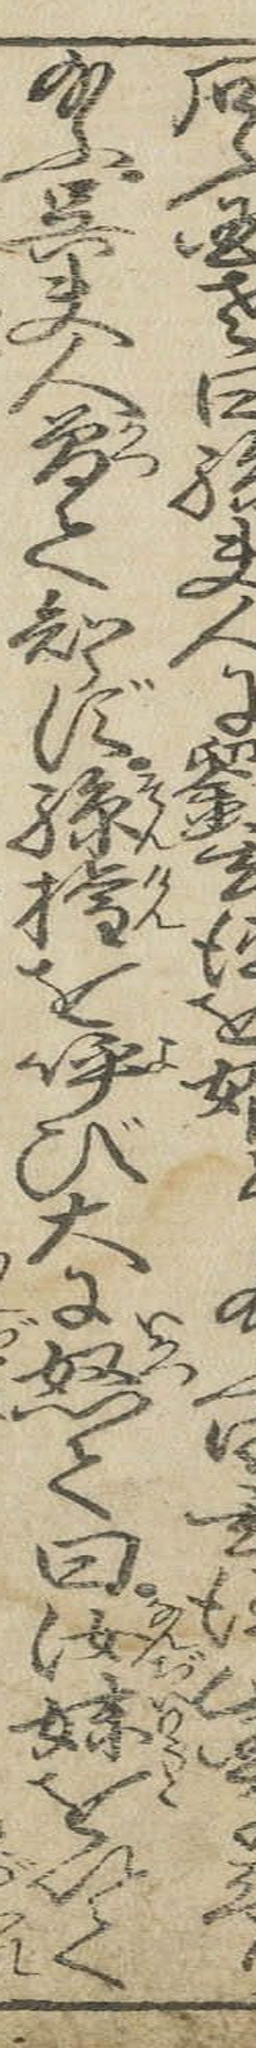給ふ。呉夫人曽てしらず。孫権を呼び大に怒て曰。汝妹を以て
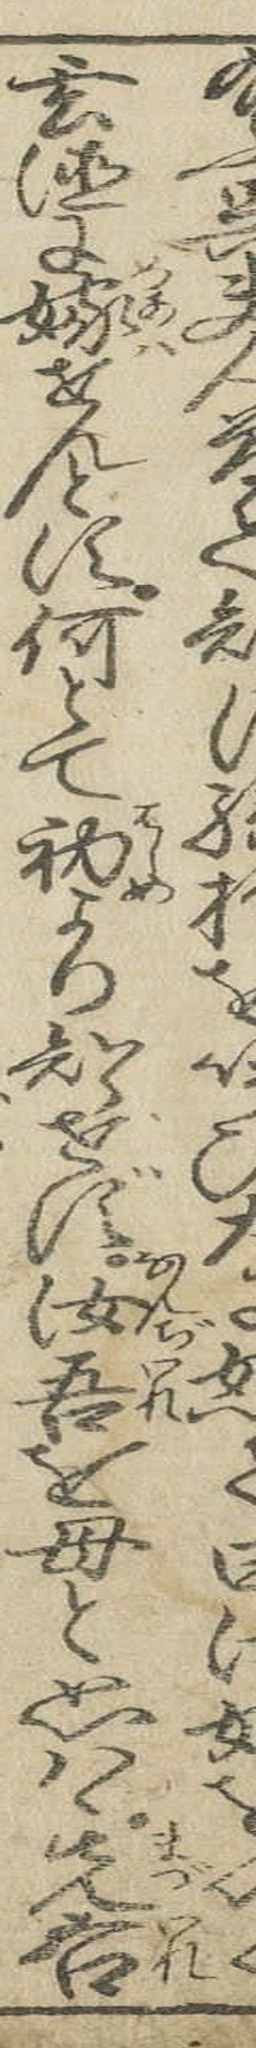玄徳に嫁せんとす。何とて初より知らせず。汝吾を母と思はゝ。先吾
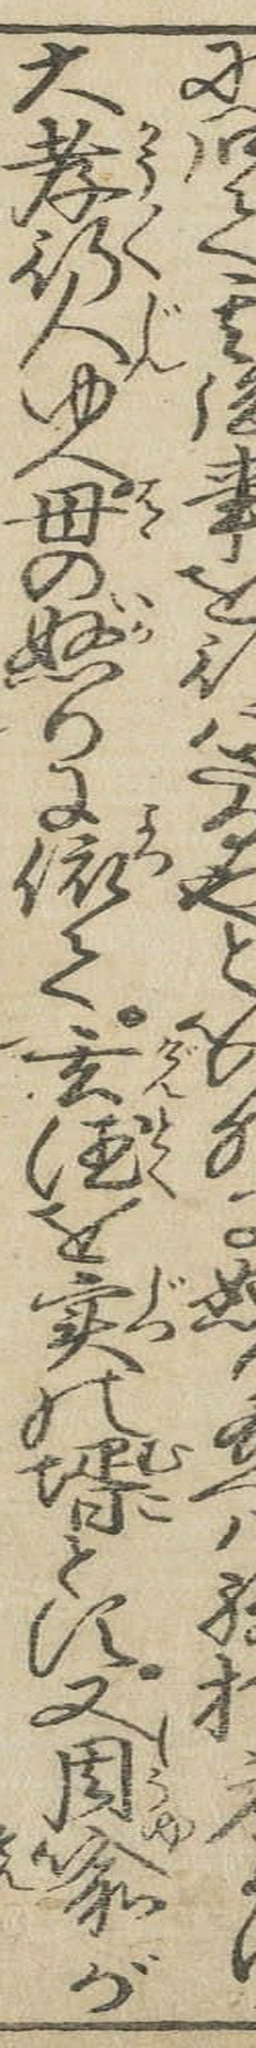大孝行人ゆへ母の怒りに依て。玄徳を実の婿とす。又周喩が
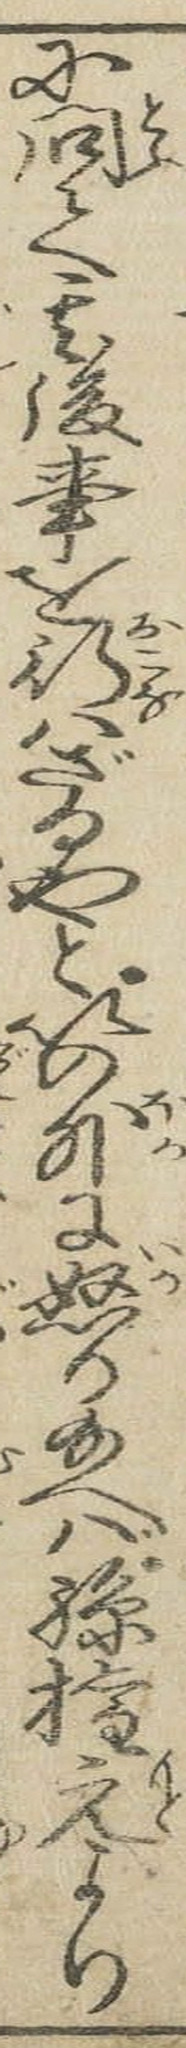に問て其後事を行はざるやと。以の外に怒り給へば。孫権元より
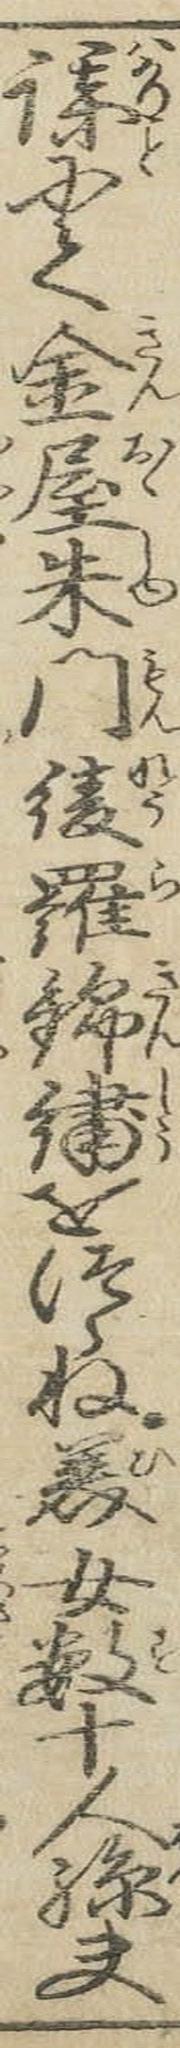謀にて金屋朱門綾羅錦繍をつらね。美女数十人孫夫
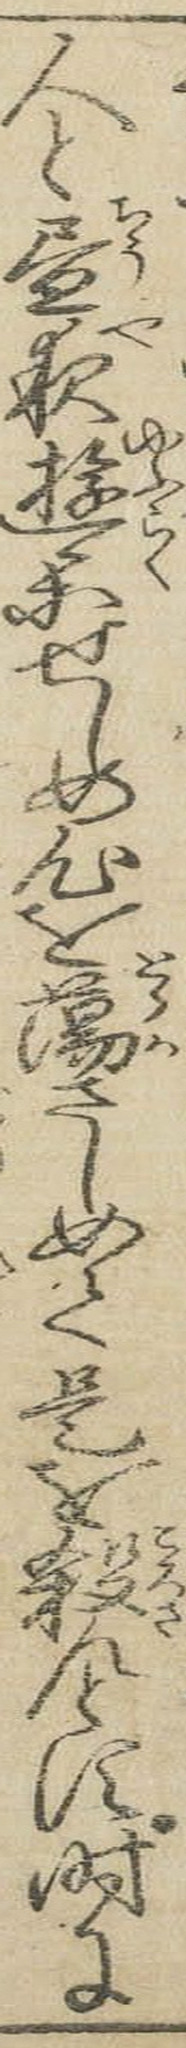人と昼夜遊楽せしめ心を蕩さしめて是を殺んとす。時に
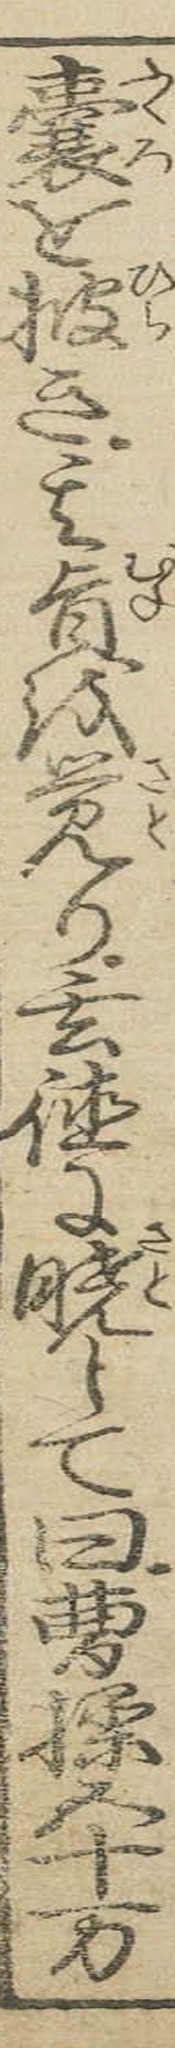嚢を披き。其旨を覚り。玄徳に暁して曰。曹操五十万
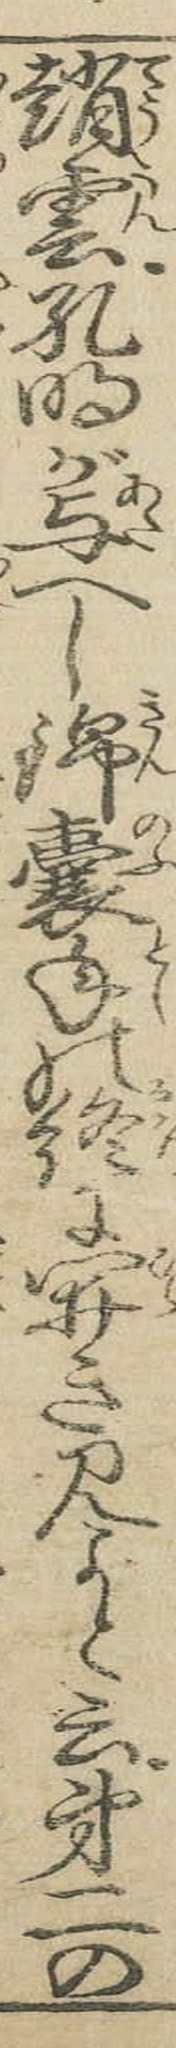趙雲。孔明が与へし錦嚢年の終に開き見よと云。第二の
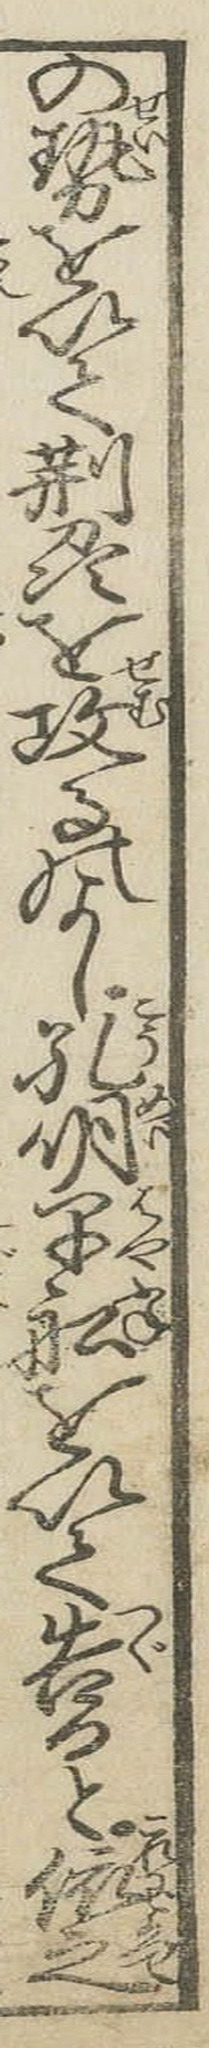の勢を以て荊州を攻るのよし。孔明早船を以て告ると。依之
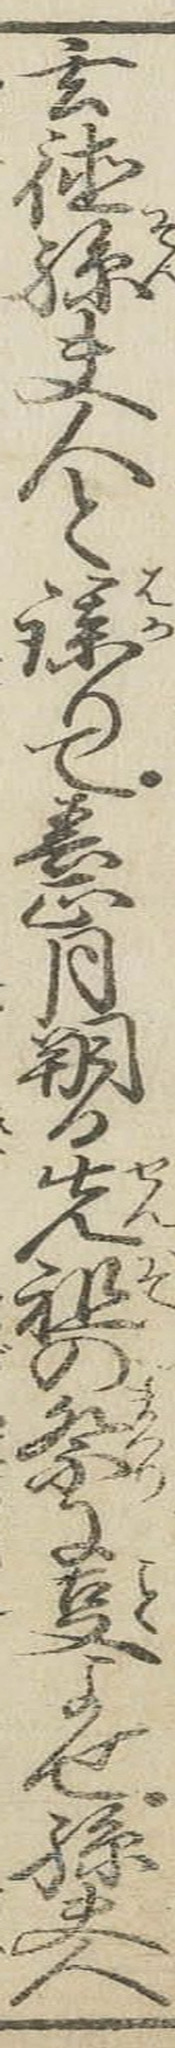玄徳孫夫人と謀りて。春正月朔日先祖の祭に事よせ。孫夫人
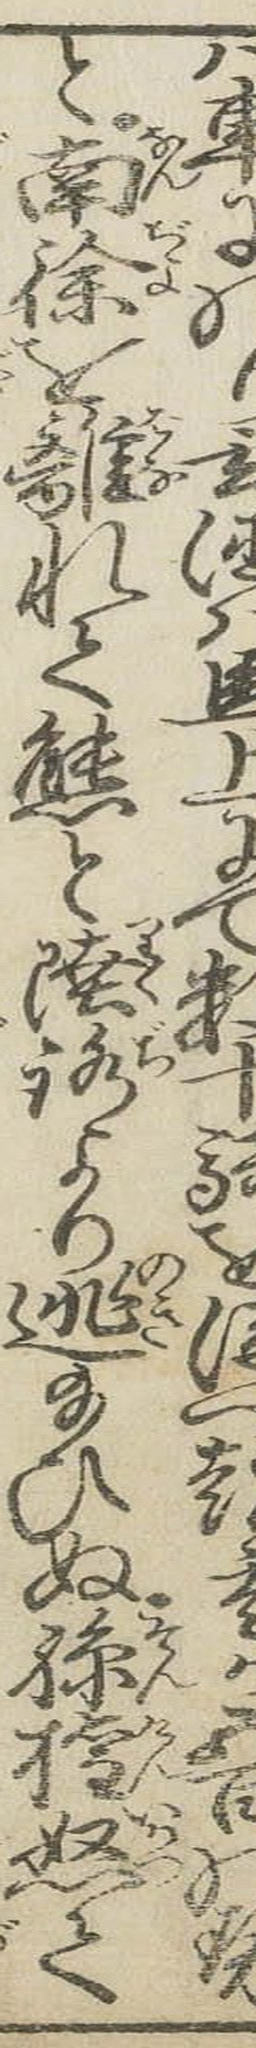と。南徐を離れて熊と陸路より逃給ひぬ。孫権怒て
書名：絵本写宝袋 9巻 7之巻
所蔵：東京学芸大学教育コンテンツアーカイブ
